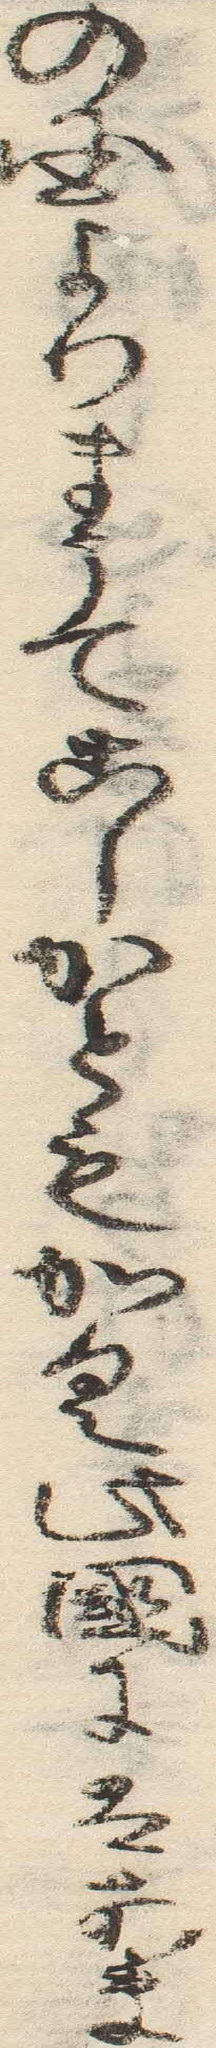の国よりまうてこしかともかく此国にはあま
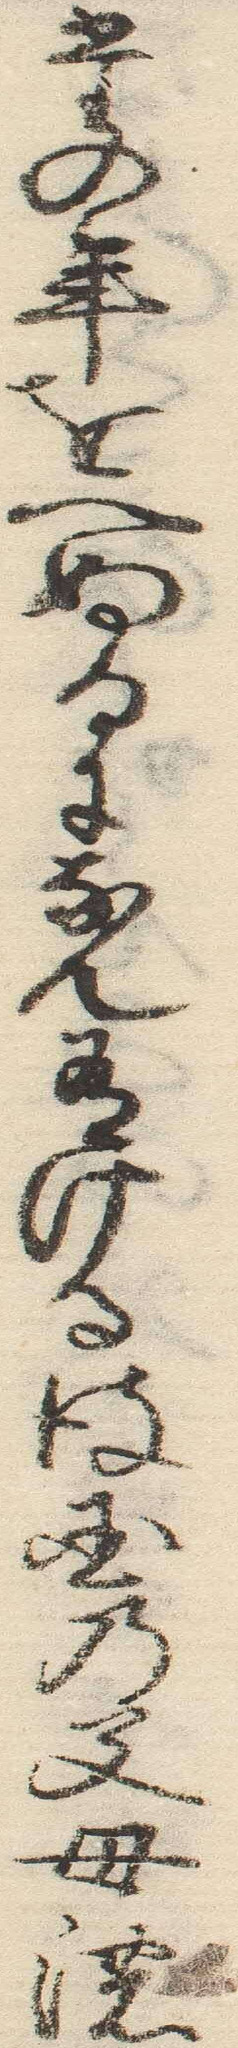たの年をへぬるになん有ける彼国の父母の
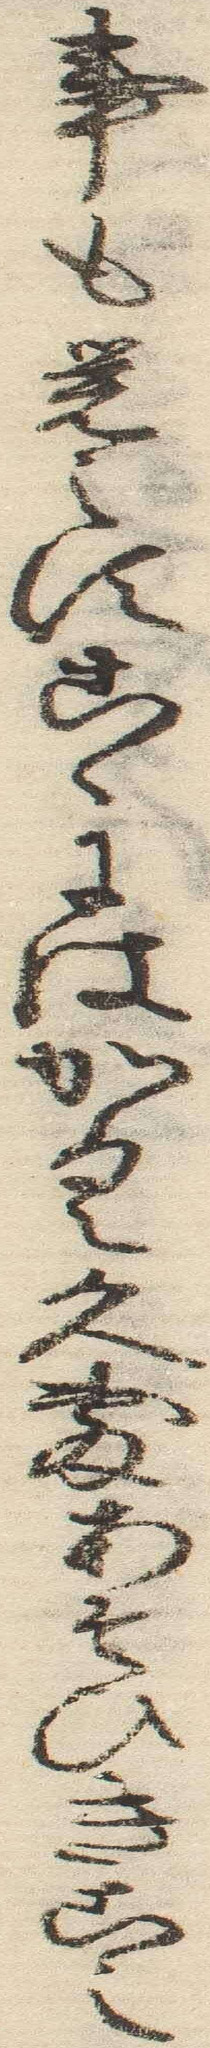事も覚えすこゝにはかく久敷あそひきこえ
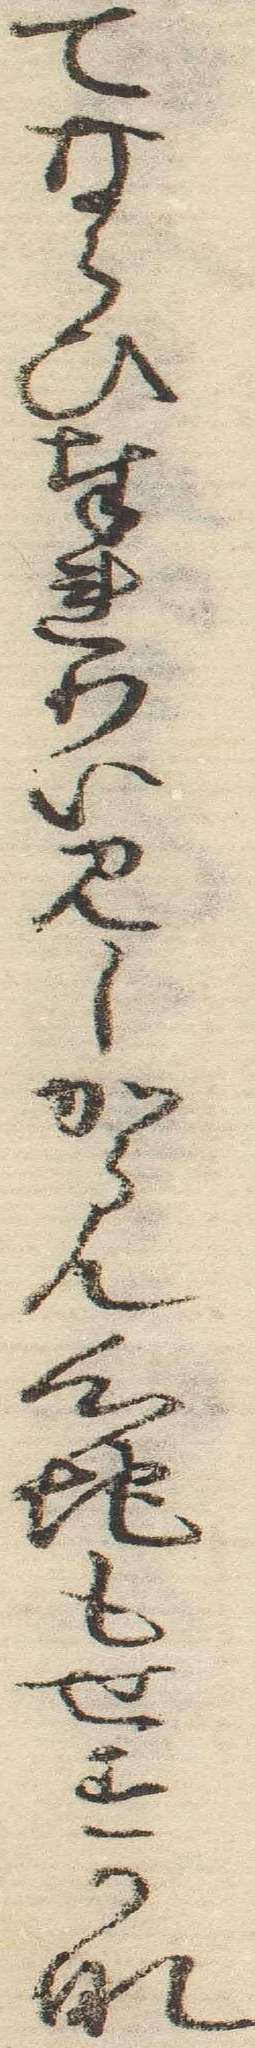てならひ奉れりいみしからん心地もせすかな
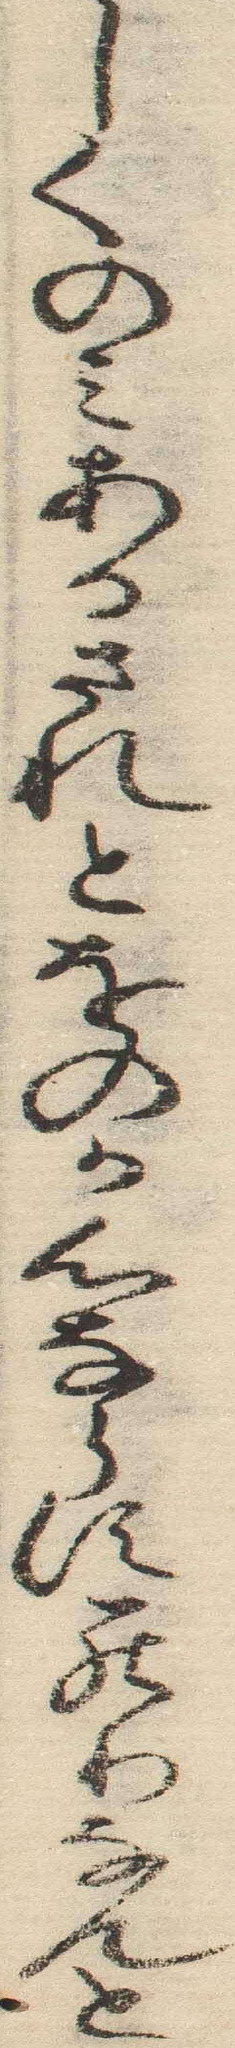しくのみあるされとをのか心ならす罷りなんと

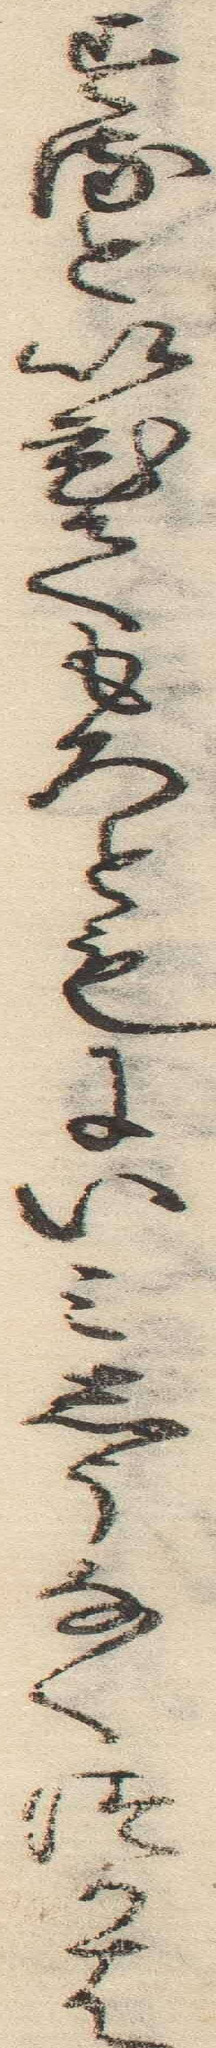するといひてもろともにいみしうなくつかは
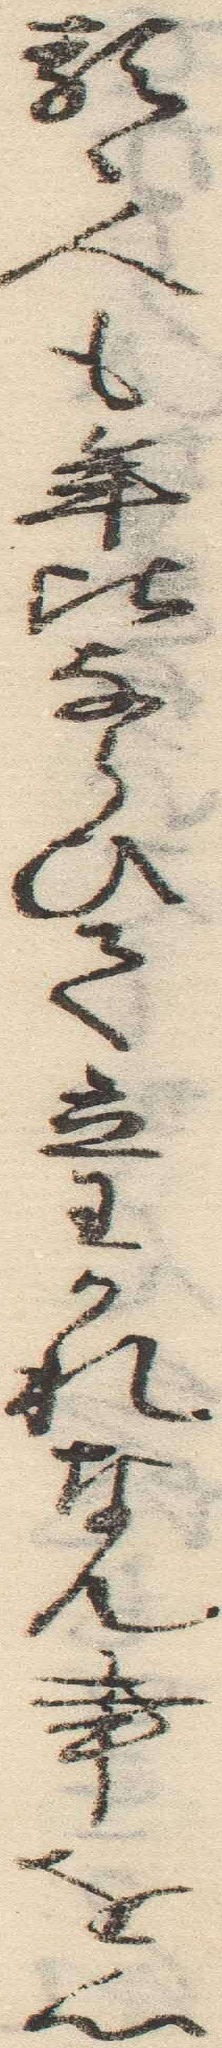るゝ人も年頃ならひて立わかれなん事を心
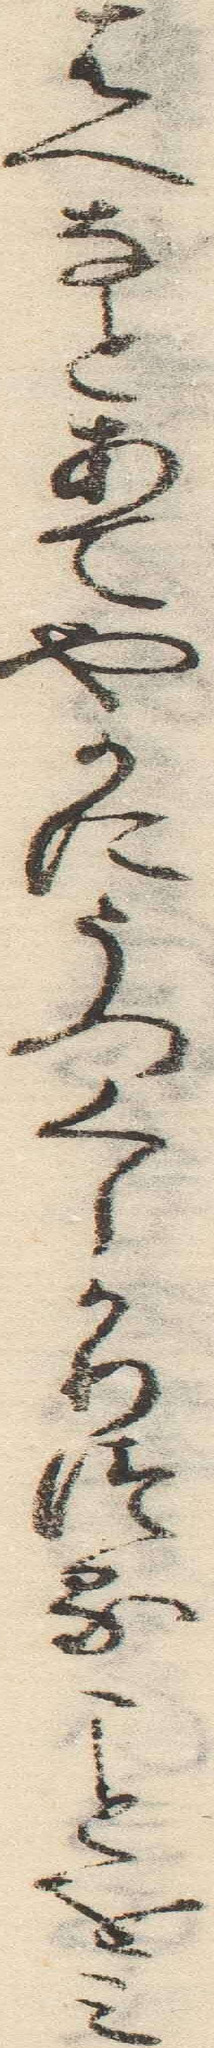はへなとあてやかにうつくしかりつることをみ
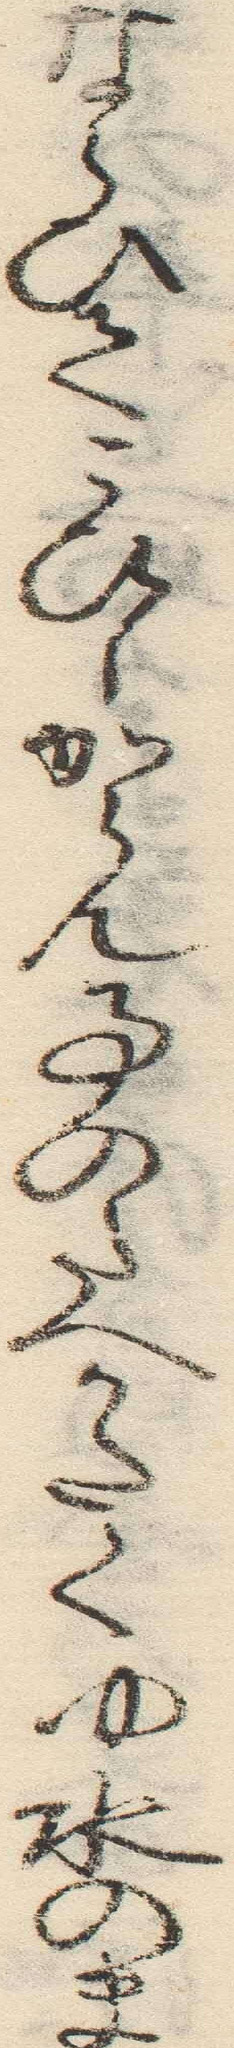ならひてこひしからん事のたへかたくゆ水のま
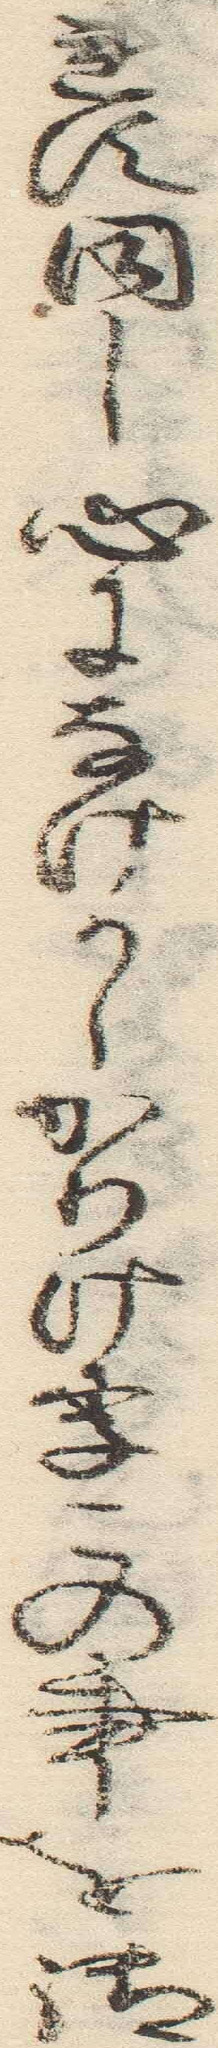れす同し心になけかしかりけりこの事を御
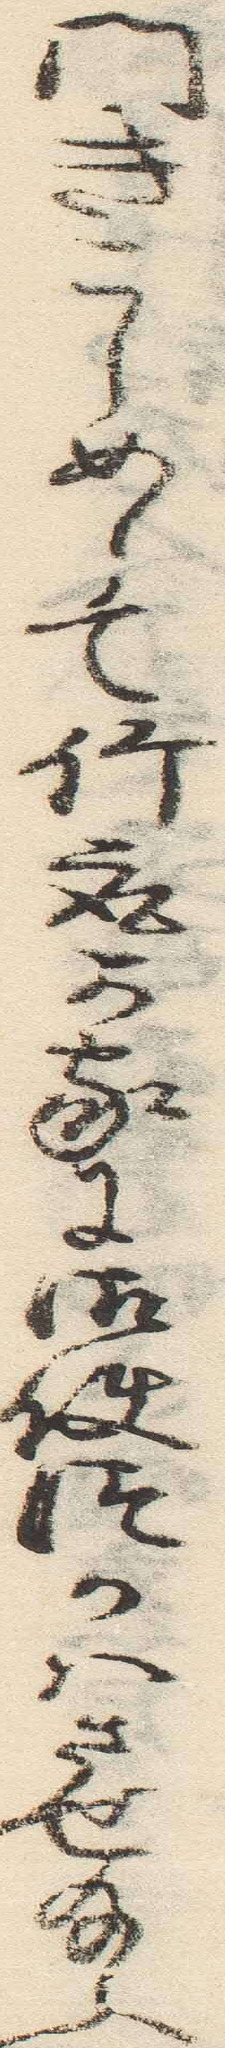門きこしめして竹取か家に御使つかはさせ給ふ
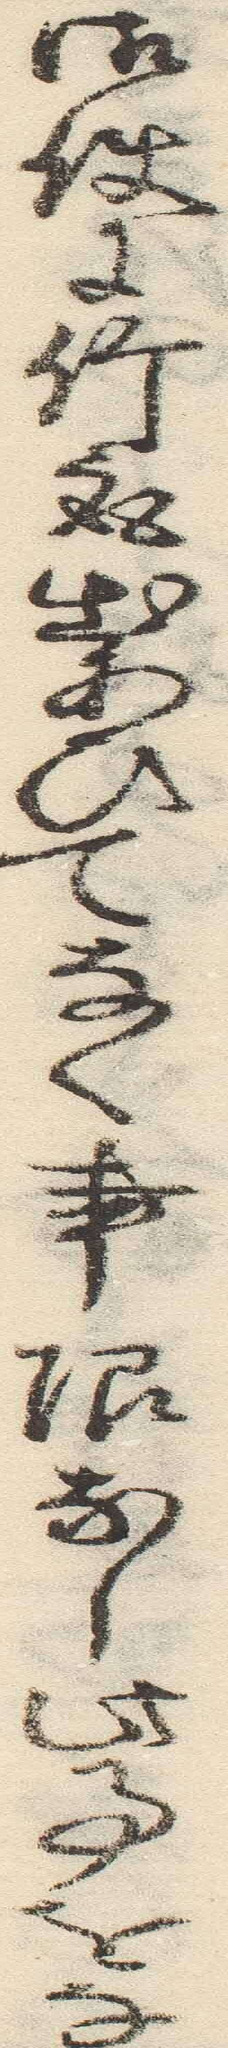御使に竹取出あひてなく事限なし此事をな
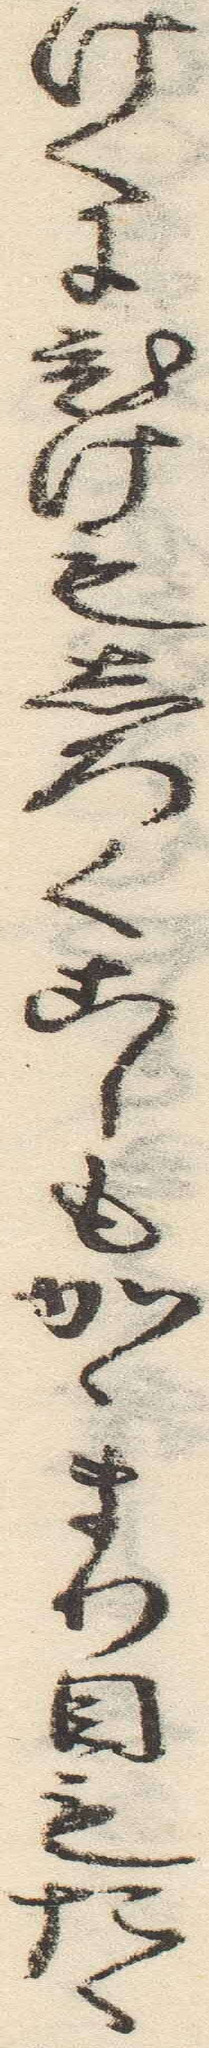けくにひけもしろくこしもかゝまり目もたゝ
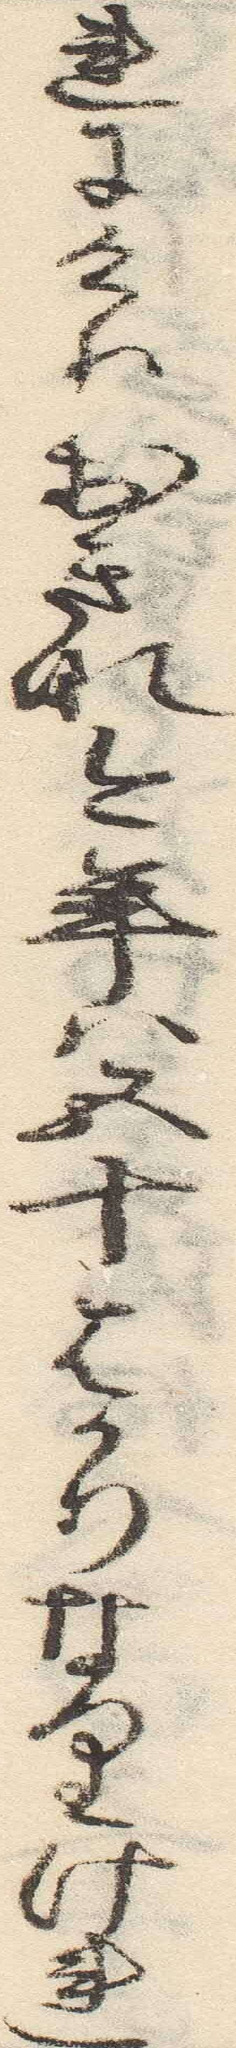れにけりおきな今年は五十はかりなりけれ
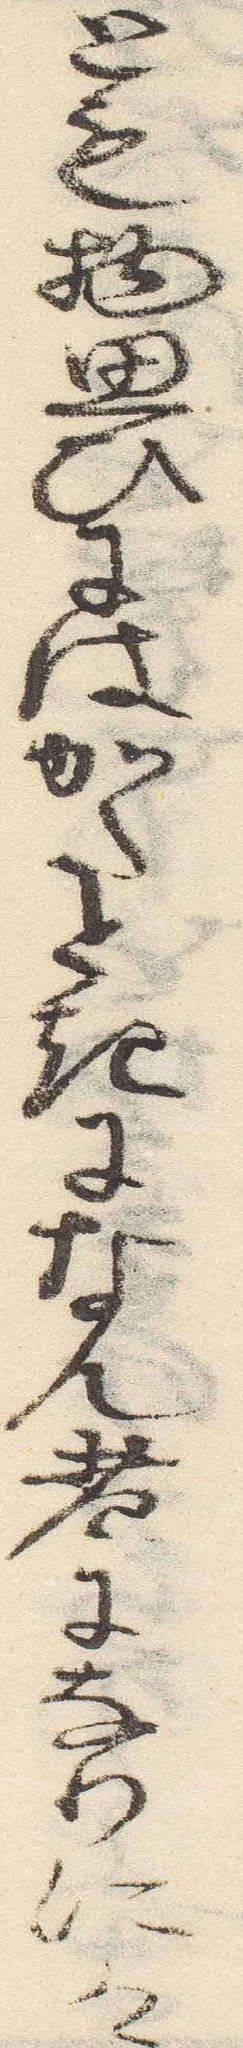とも物思ひにはかたときになん老になりにけ
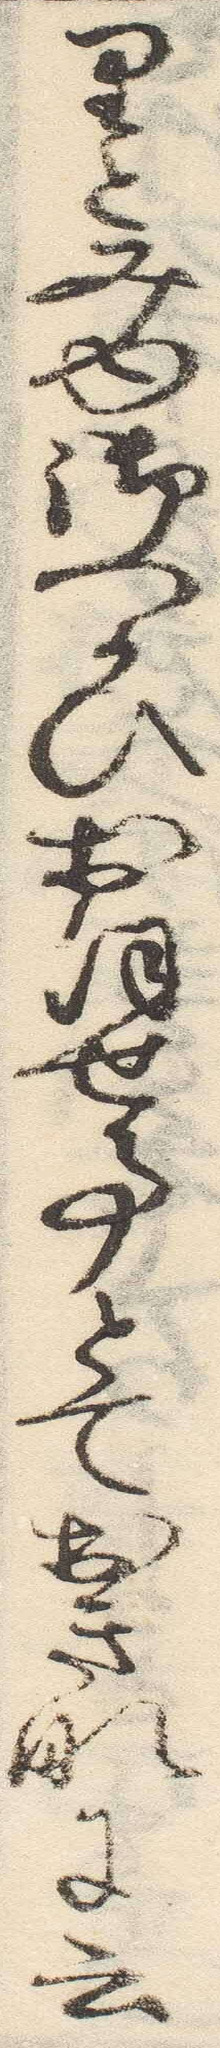りとみゆつかひおほせ事とておきなに云
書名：竹取物語
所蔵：東京学芸大学附属図書館 国文学研究資料館
